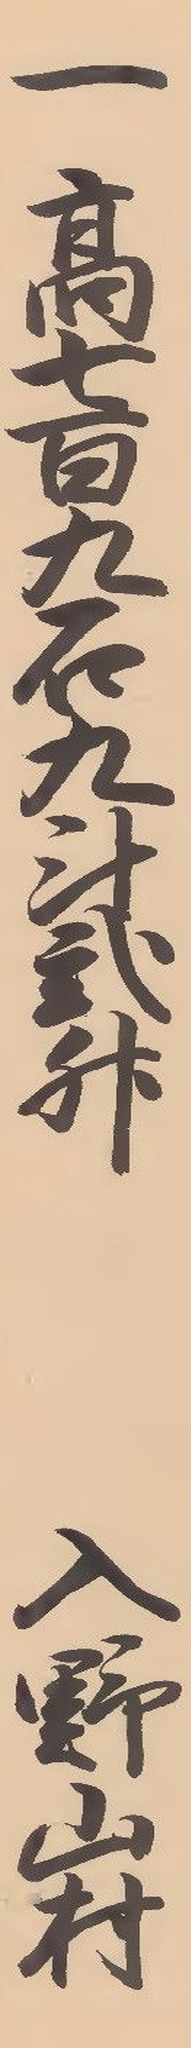一高七百九石九斗弐升入野山村

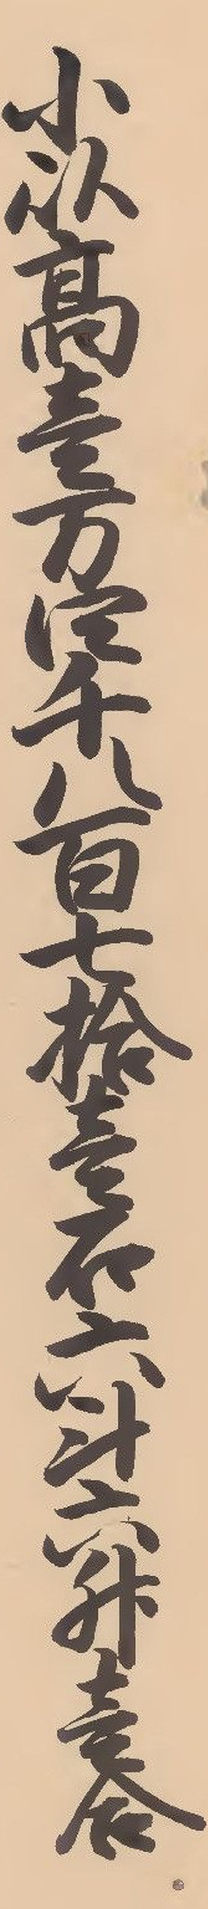小以高壱万四千八百七拾壱石六斗六升壱合
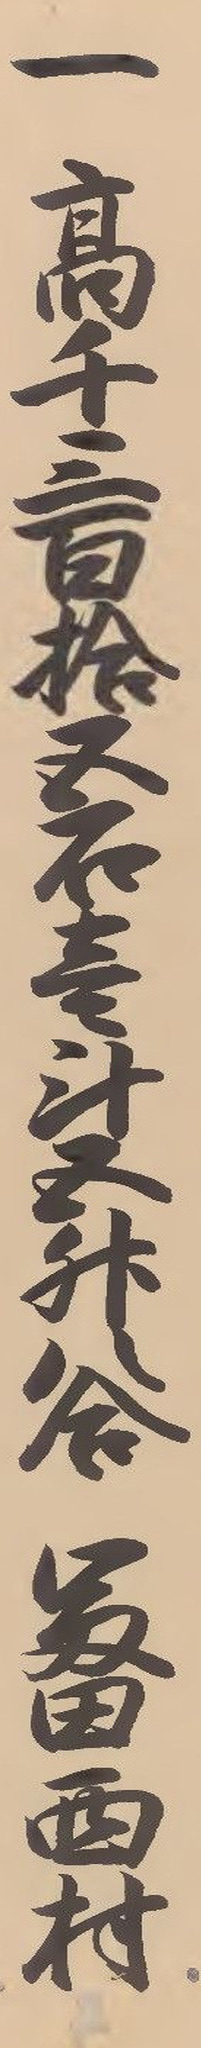一高千三百拾五石壱斗五升八合富田西村
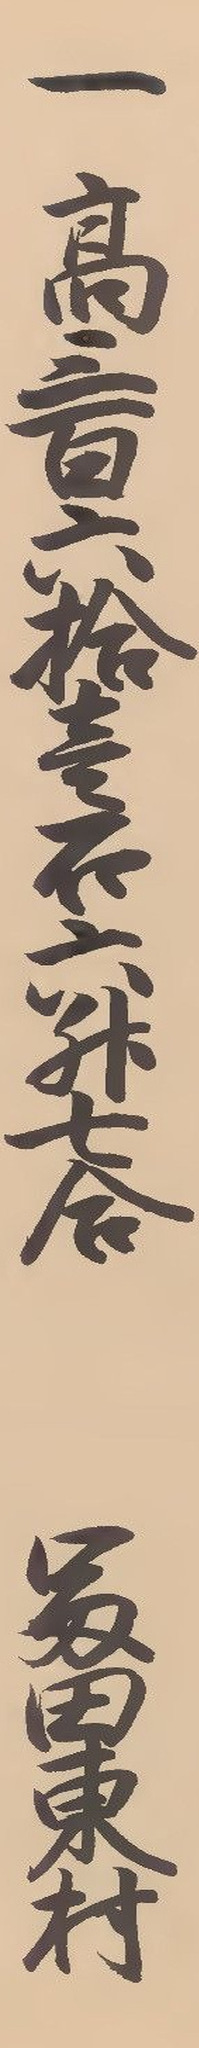一高三百六拾壱石六升七合富田東村
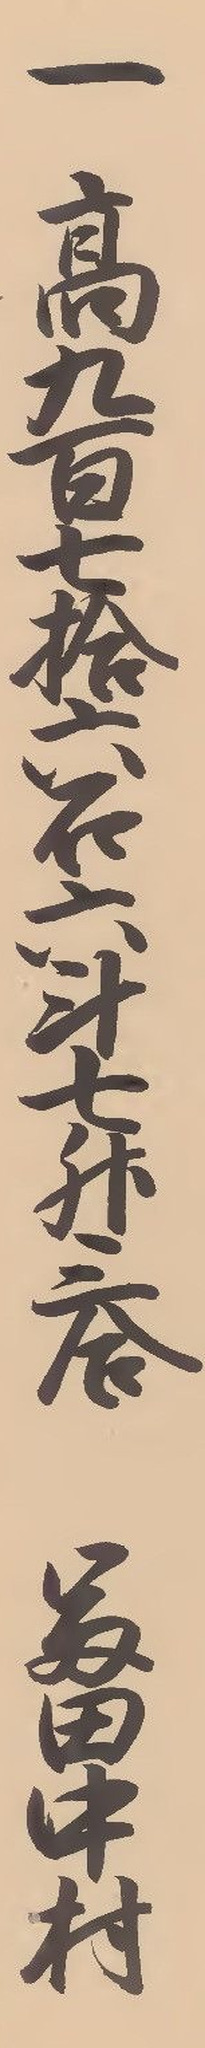一高九百七拾六石六斗七升三合富田中村

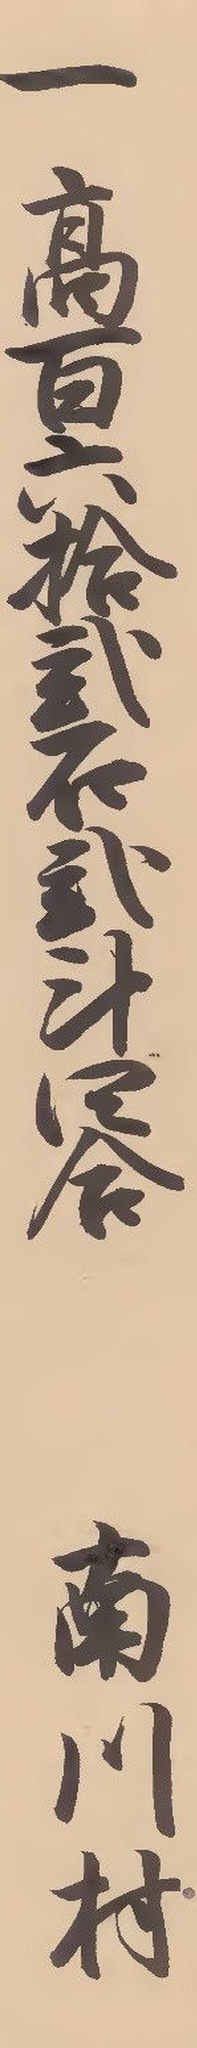一高百六拾弐石弐斗四合南川村
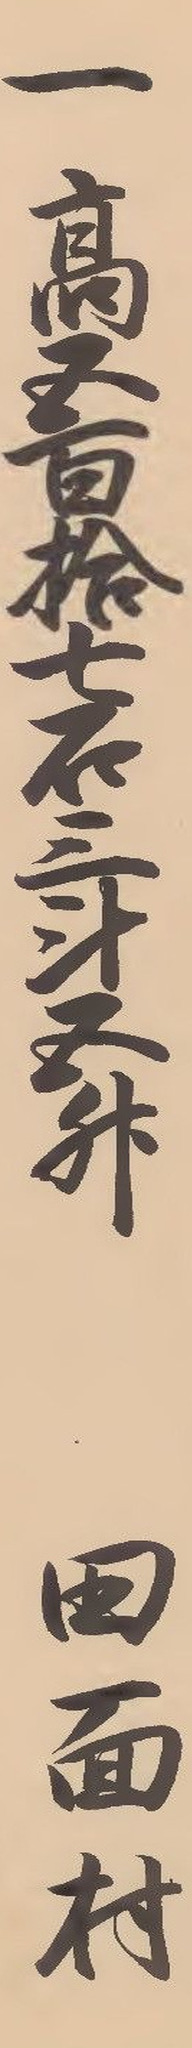一高五百拾七石三斗五升田面村
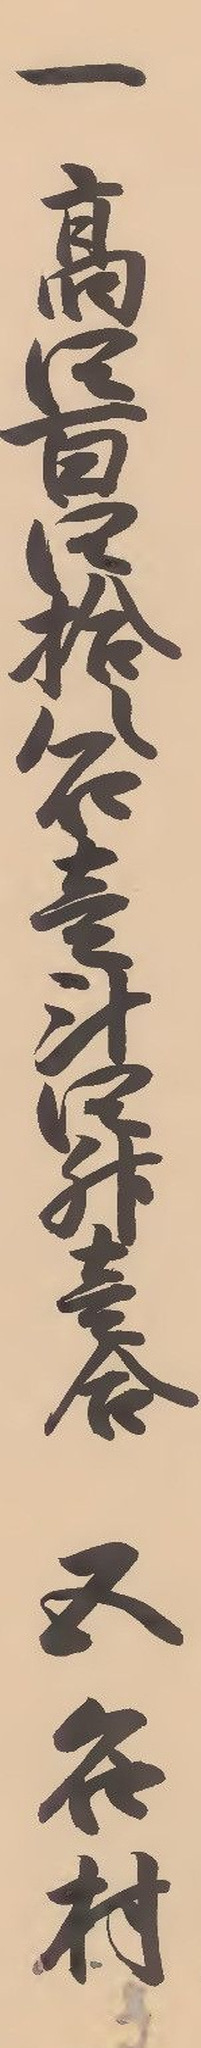一高四百四拾八石壱斗四升壱合五名村
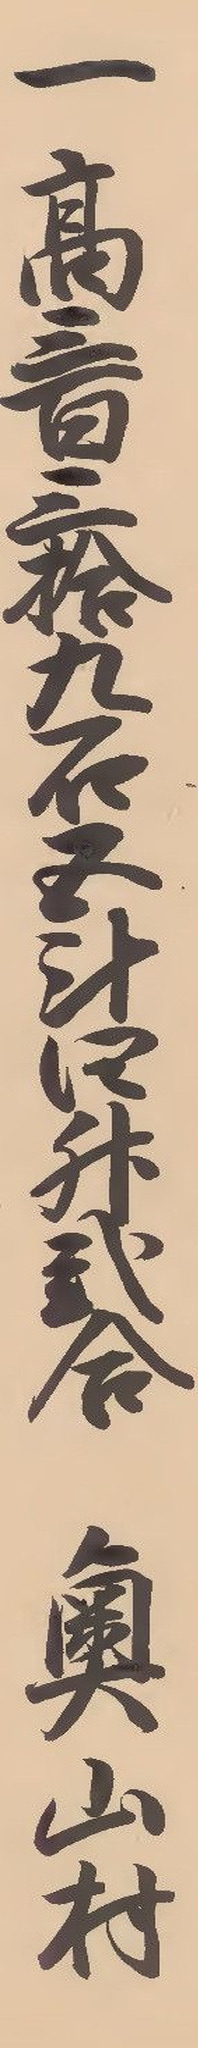一高三百三拾九石五斗四升弐合奥山村
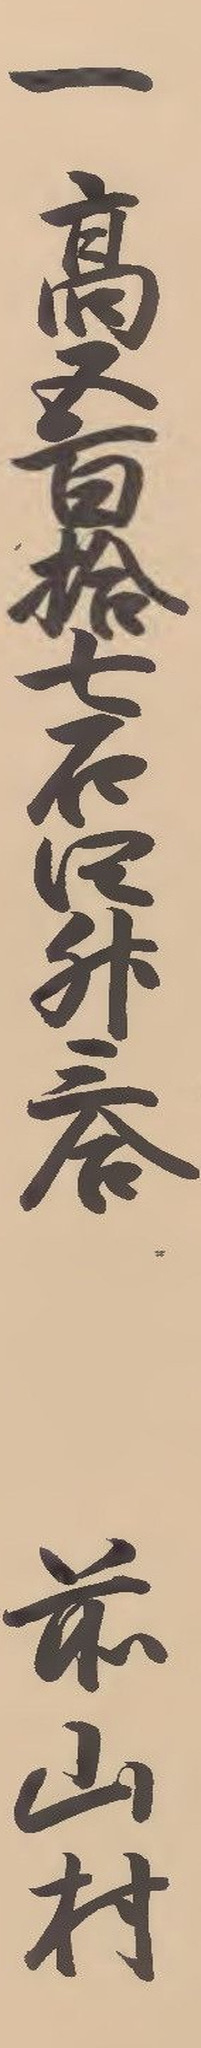一高五百拾七石四升三合前山村
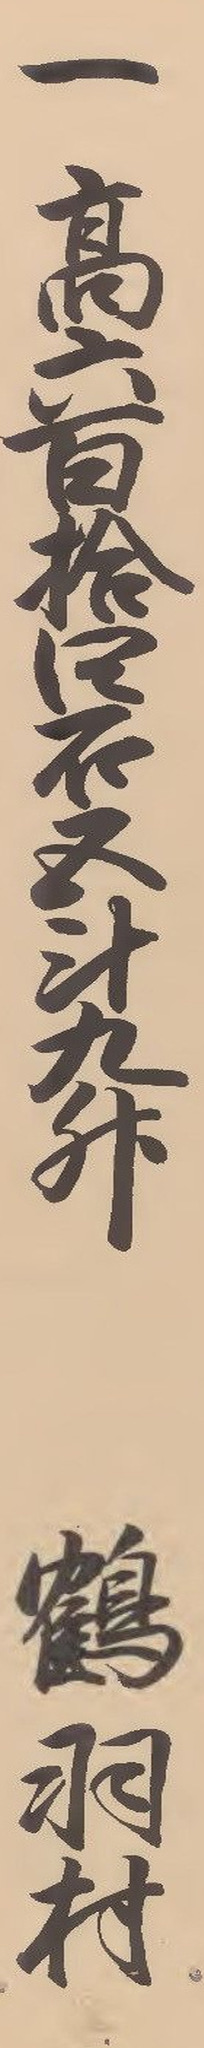一高六百拾四石五斗九升鶴羽村
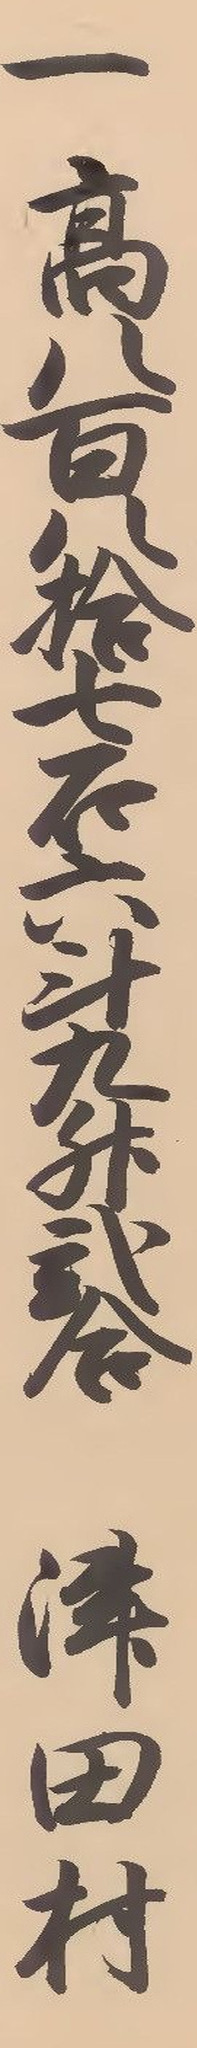一高八百八拾七石六斗九升弐合津田村
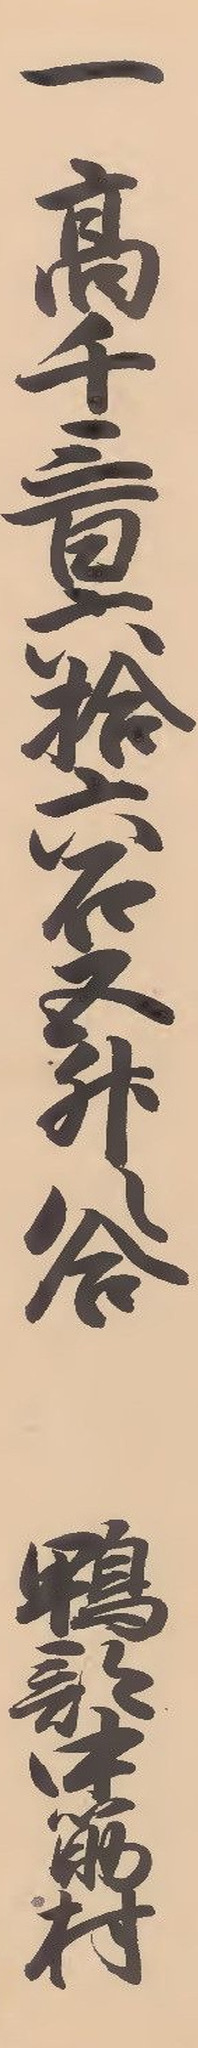一高千三百六拾六石五升八合鴨部中筋村

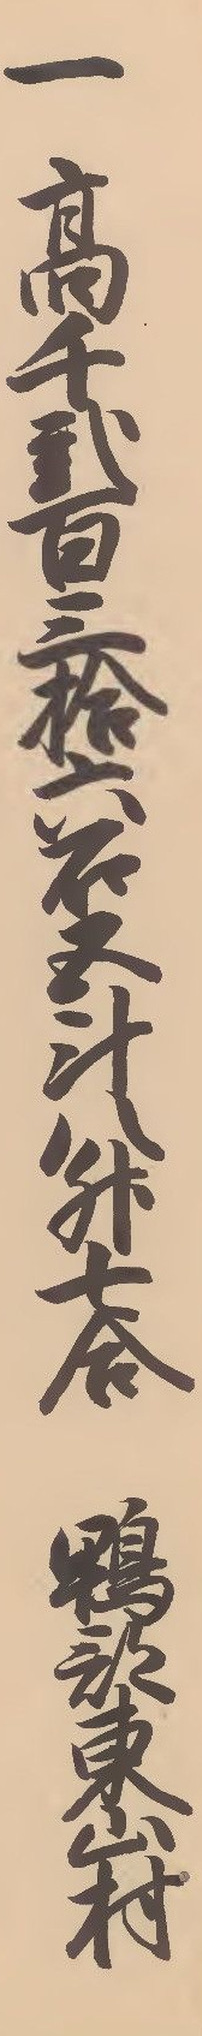一高千弐百三拾六石五斗八升七合鴨部東山村
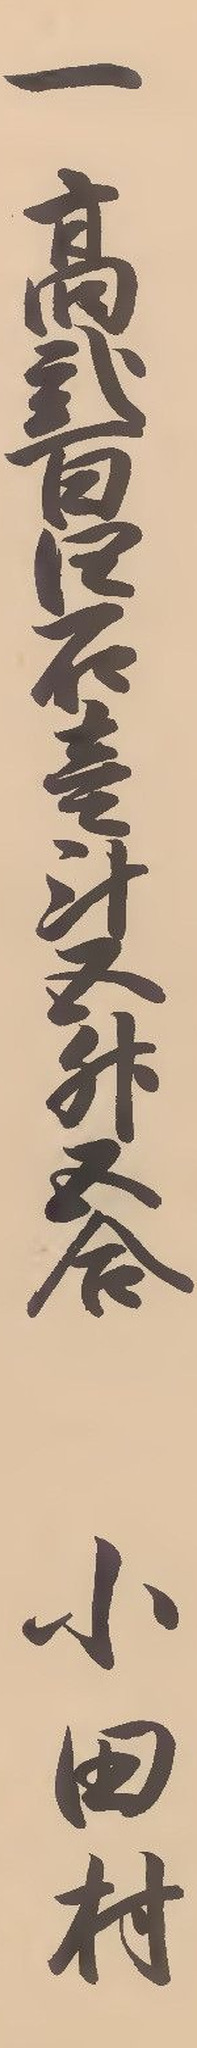一高弐百四石壱斗五升五合小田村
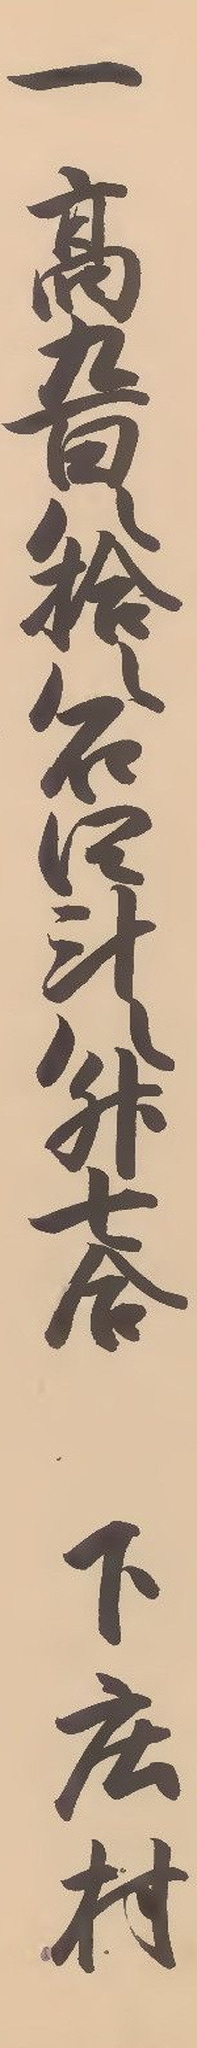一高九百八拾八石四斗八升七合下庄村
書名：讃岐国郷帳
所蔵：国立公文書館 National Archives of Japan
